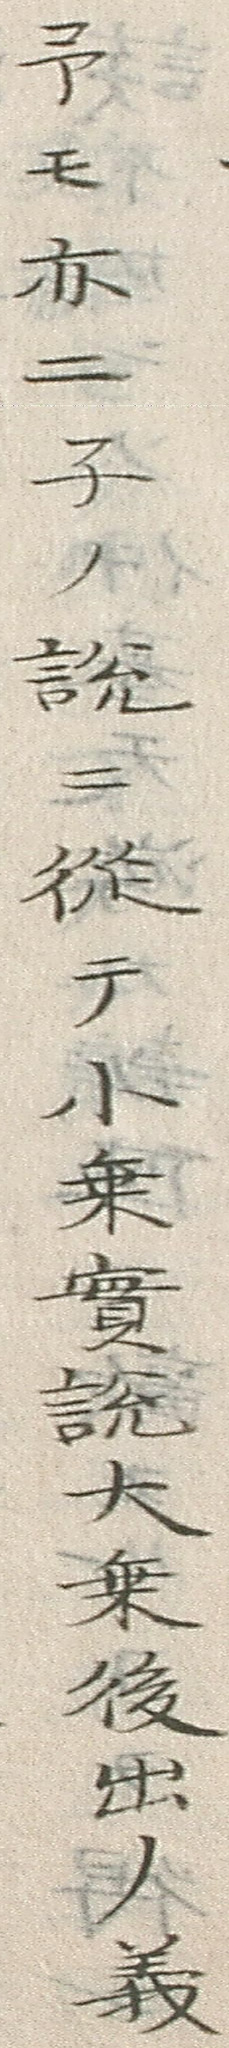予モ亦二子ノ説ニ従テ小乗実説大乗後出ノ義
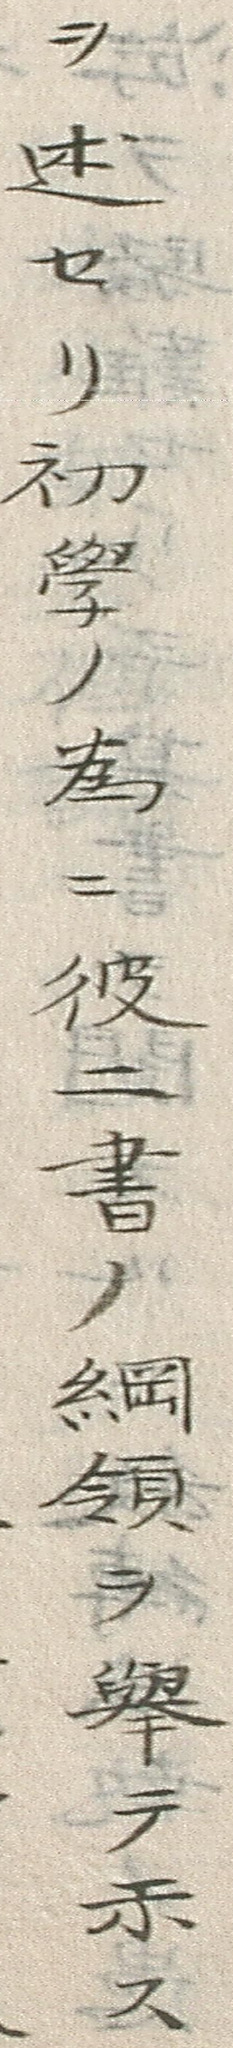ヲ述セリ初学ノ為ニ彼二書ノ綱領ヲ挙テ示ス
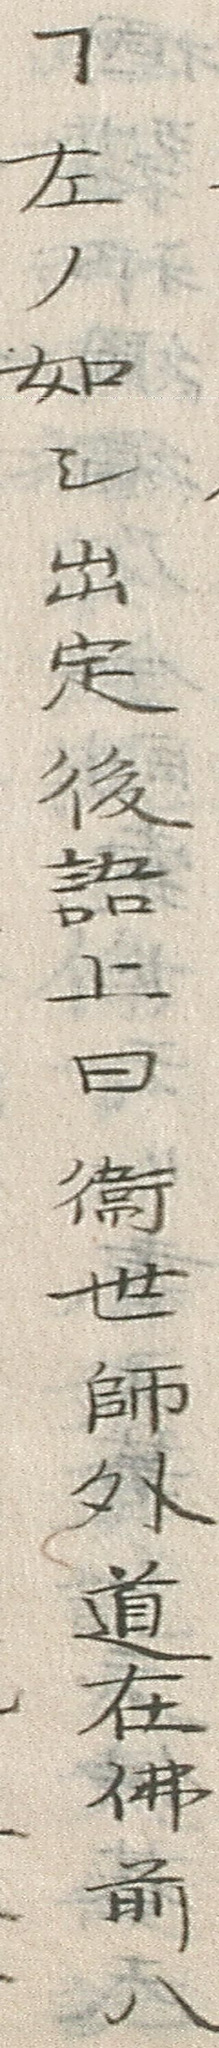コト左ノ如シ出定後語上曰衛世師外道在仏前八
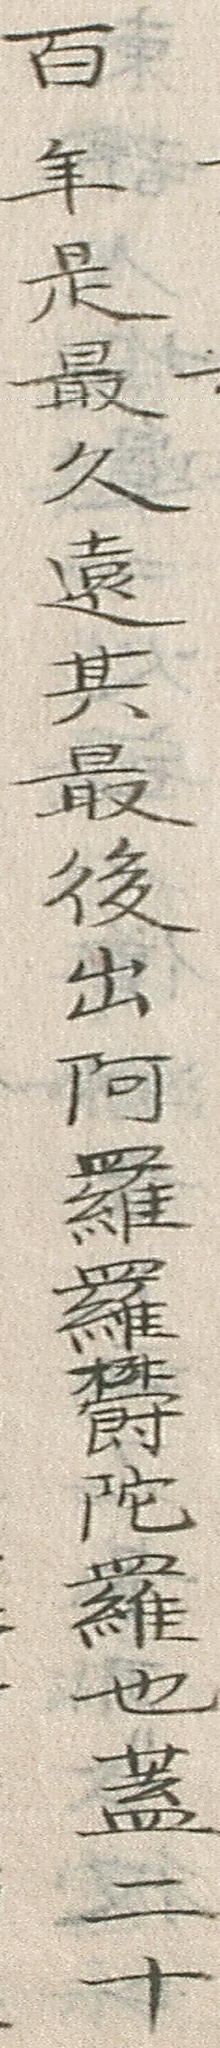百年是最久遠其最後出阿羅羅欝陀羅也蓋二十
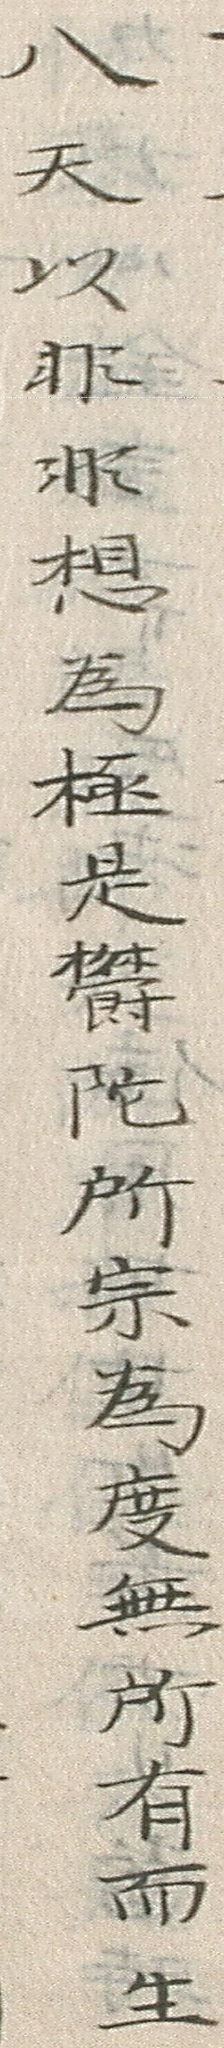八天以非非想為極是欝陀所宗為度無所有而生
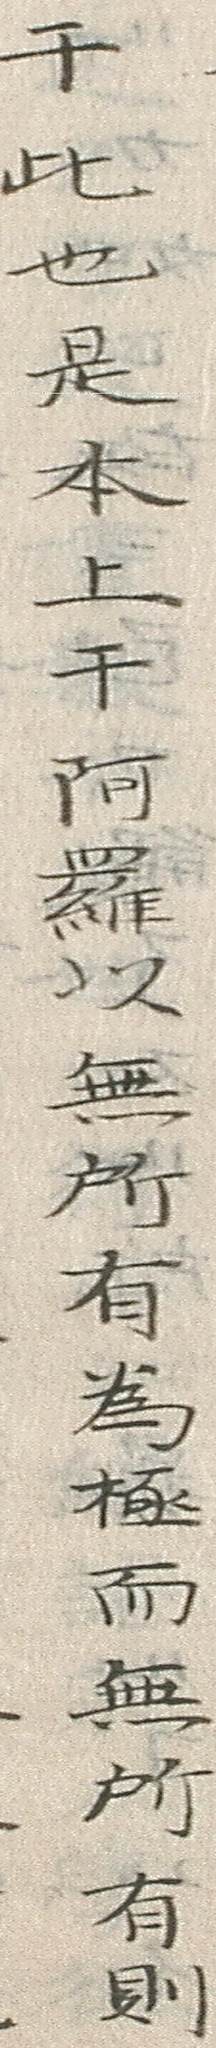干此也是本上干阿羅以無所有為極而無所有則
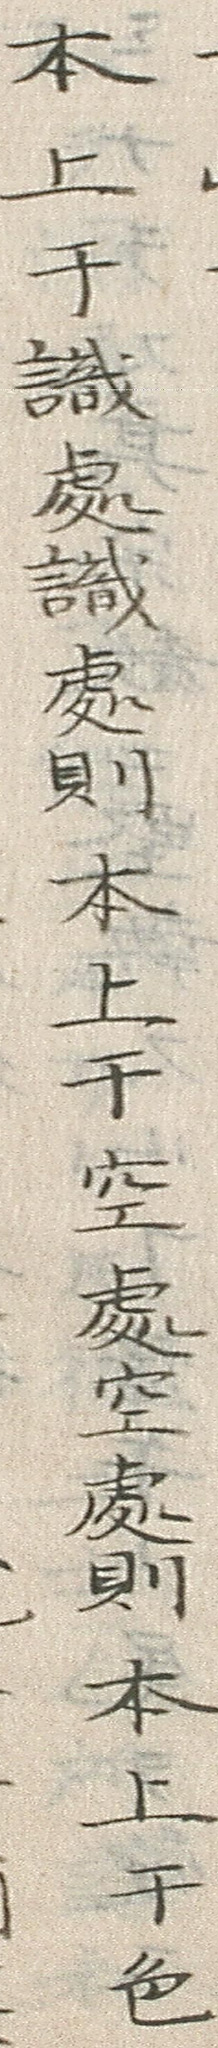本上干識処識処則本上干空処空処則本上干色
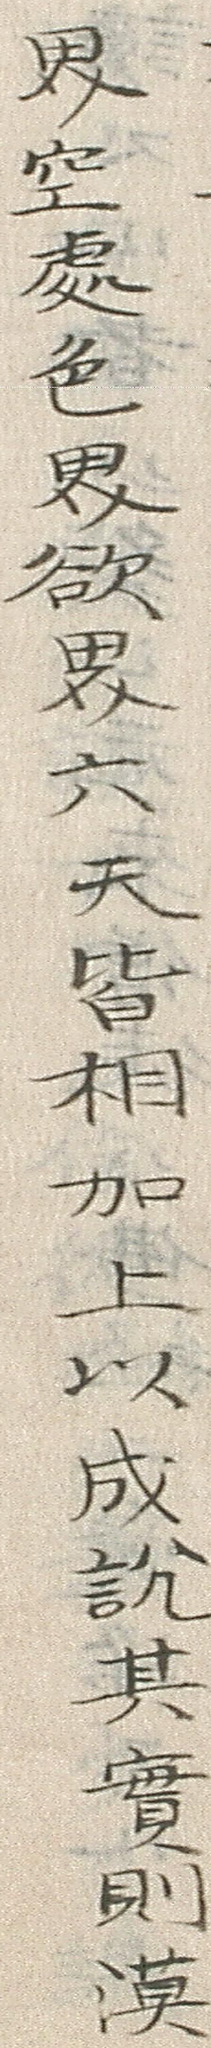界空処色界欲界六天皆相加上以成説其実則漠
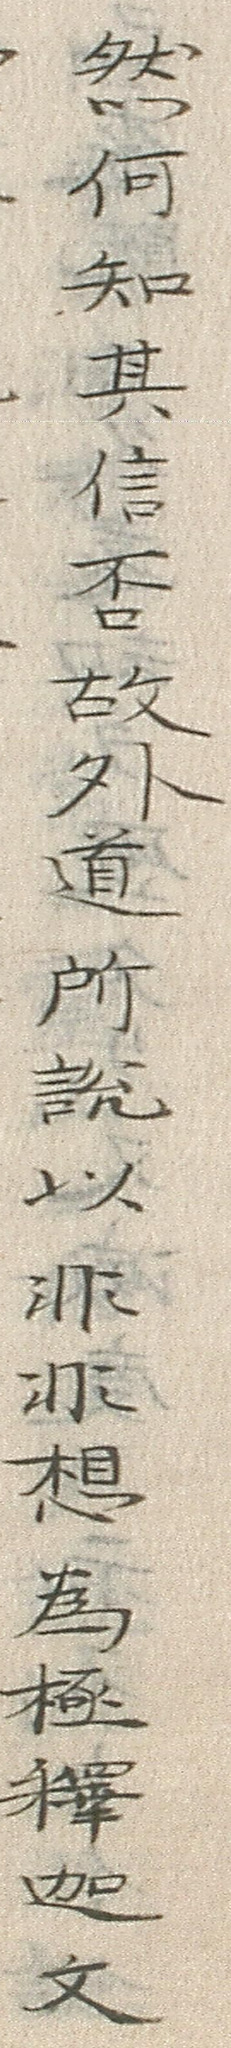然何知其信否故外道所説以非非想為極釈迦文
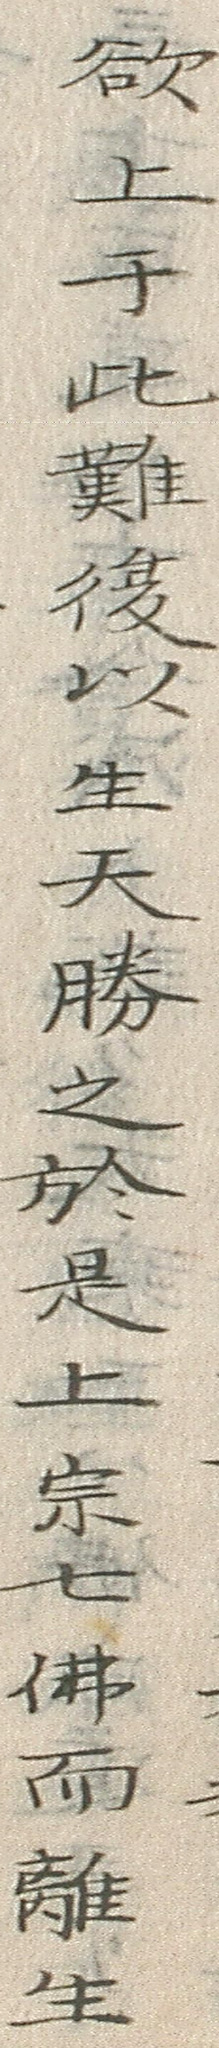欲上干此難復以生天勝之於是上宗七仏而離生
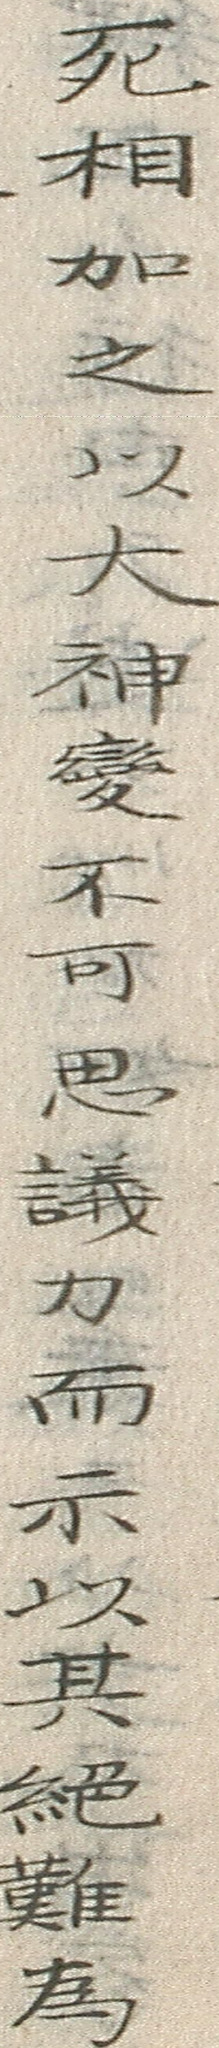死相加之以大神変不可思議力而示以其絶難為
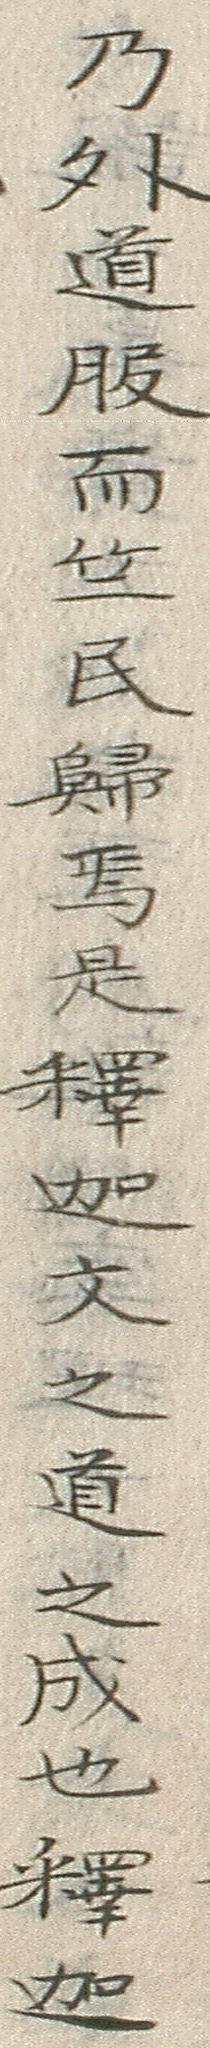乃外道服而竺民帰焉是釈迦文之道之成也釈迦
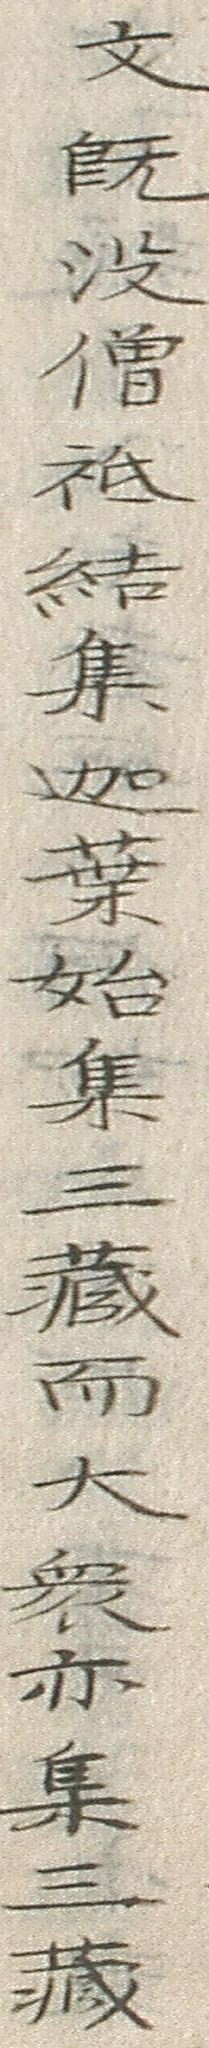文既没僧祇結集迦葉始集三蔵而大衆亦集三蔵
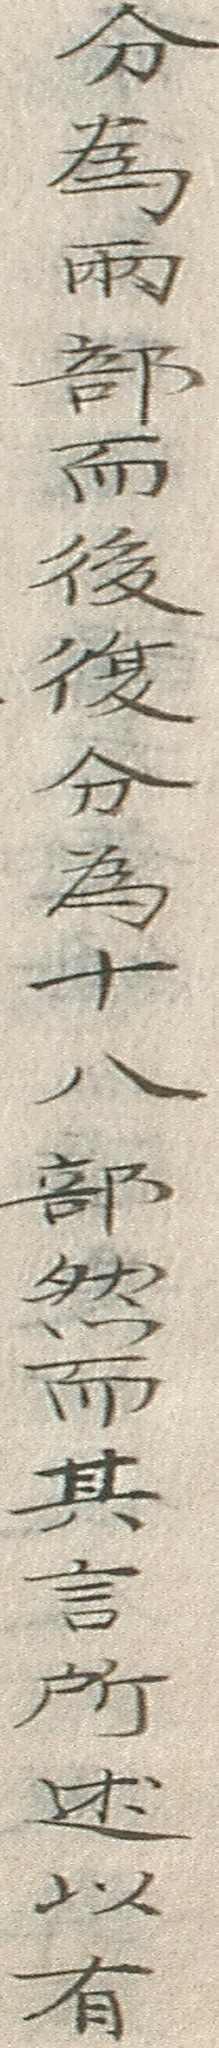分為両部而後復分為十八部然而其言所述以有
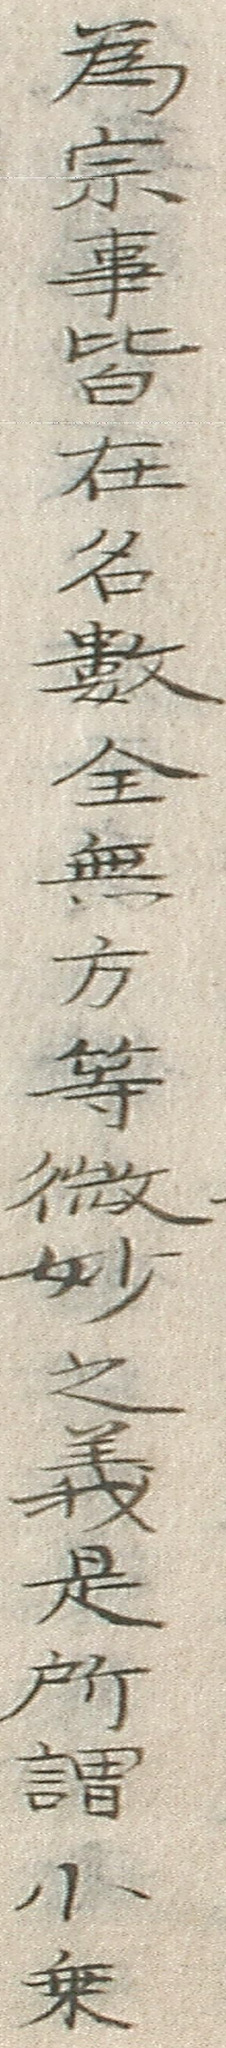為宗事皆在名数全無方等微妙之義是所謂小乗
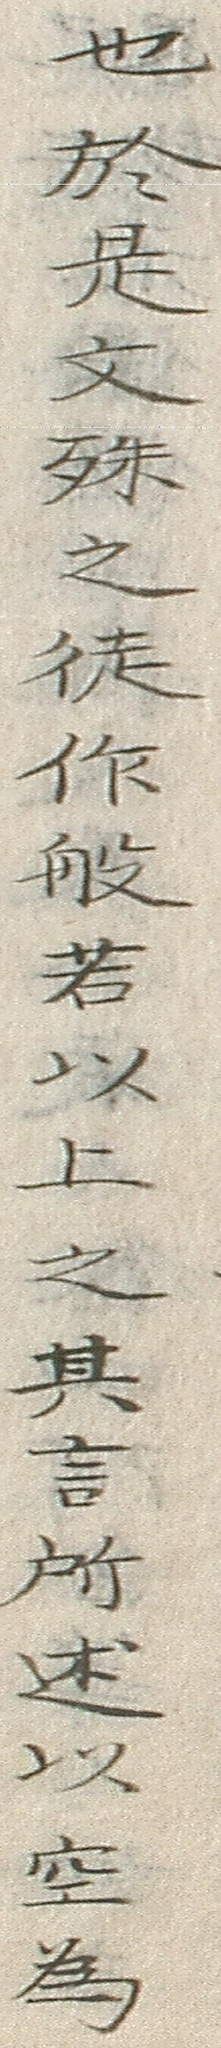也於是文殊之徒作般若以上之其言所述以空為
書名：天學略名目羽翼　全
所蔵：東京大学地震研究所図書室 Earthquake Research Institute Library, The University of Tokyo, JAPAN
